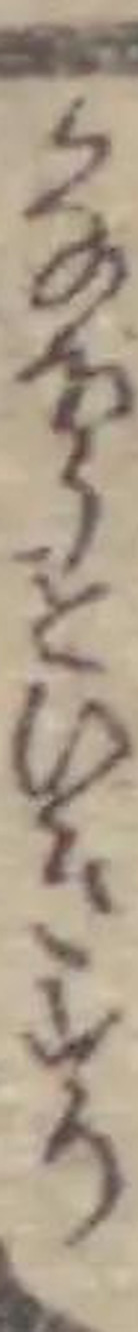かなぼうをひきすり
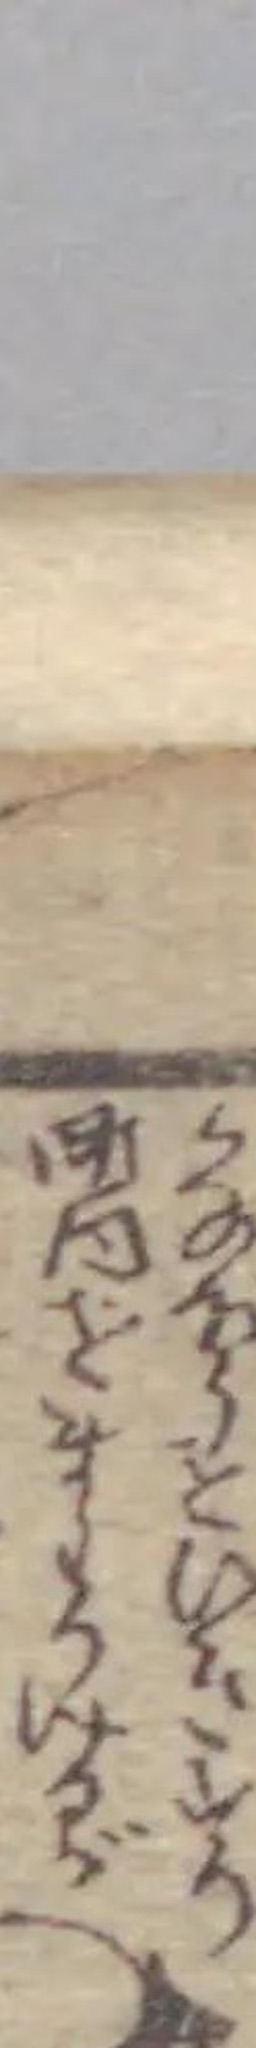町内をまわりけるが
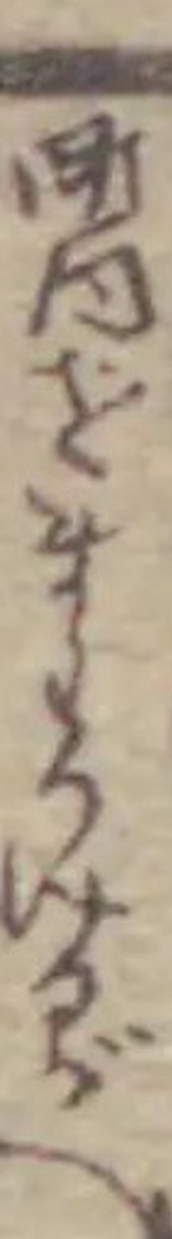町内をまわりけるが
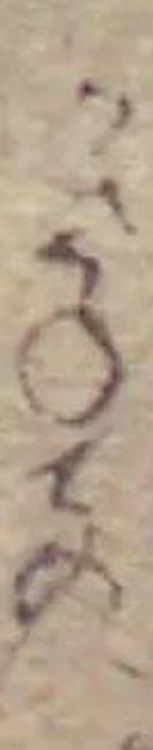かさねての
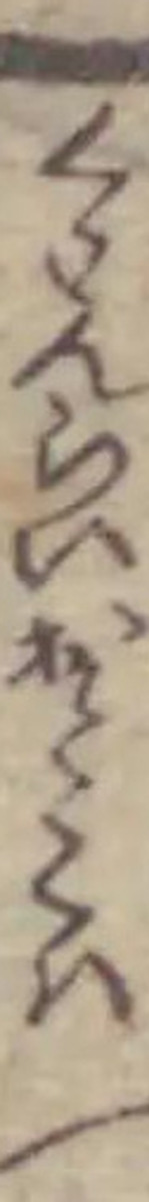くわんらいおとこは
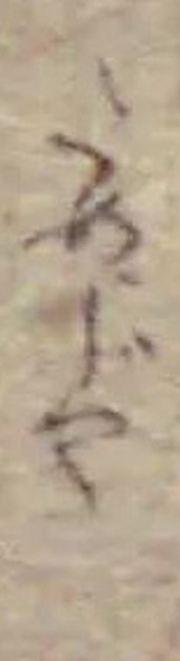ためじや
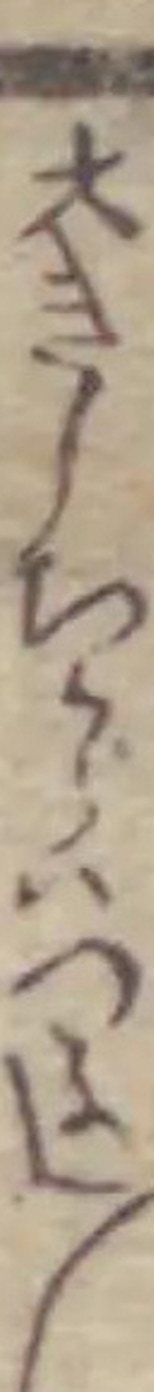大きしちからはつよし
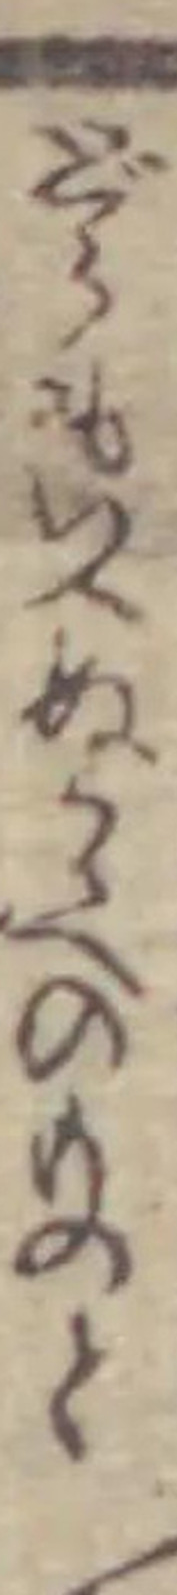どうもいへぬかゝへのものと
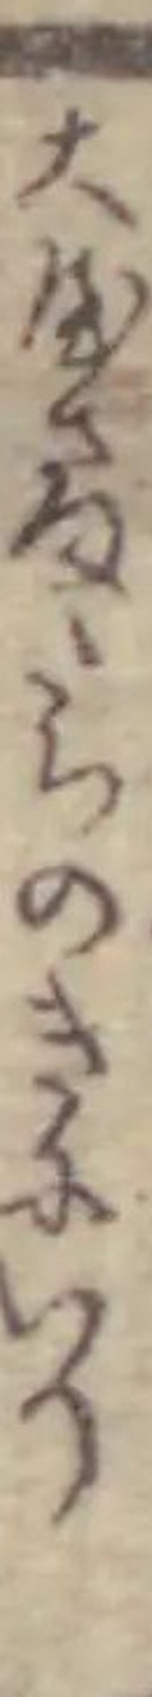大屋さまたちのきにいり
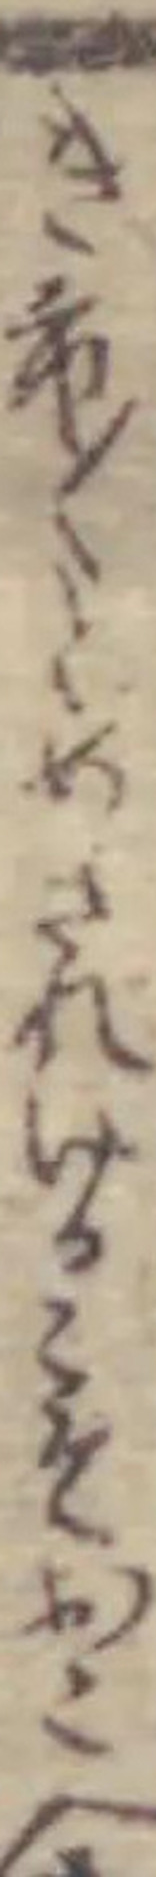き市〳〵とめされけるこそおこ
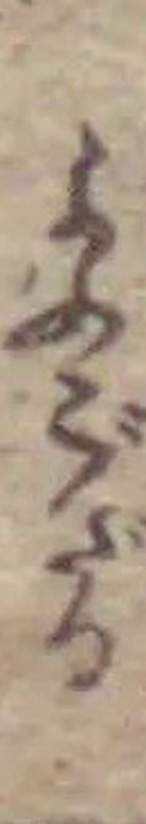よふござる
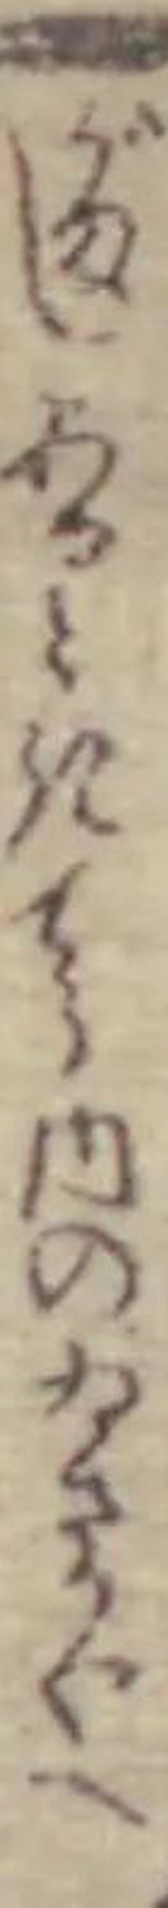がましあるときてう内のゐさかやへ
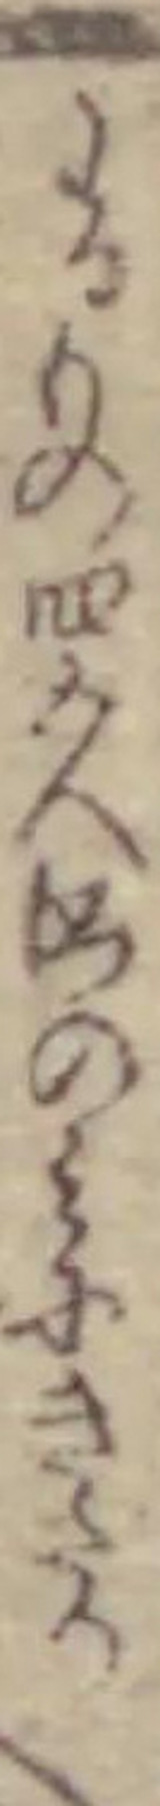わるもの四五人酒のみにきたり
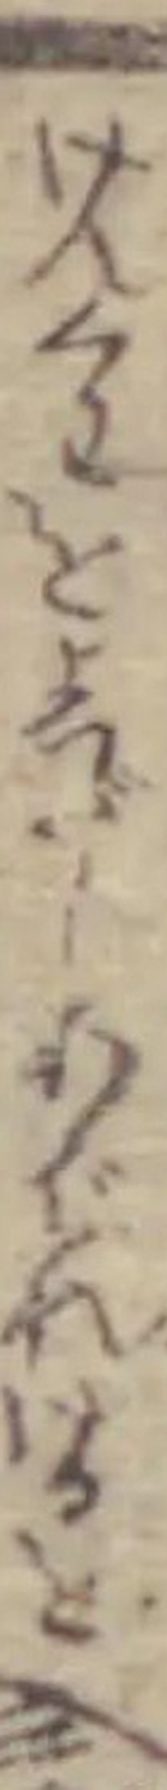けんくわをしだしあばれけるを
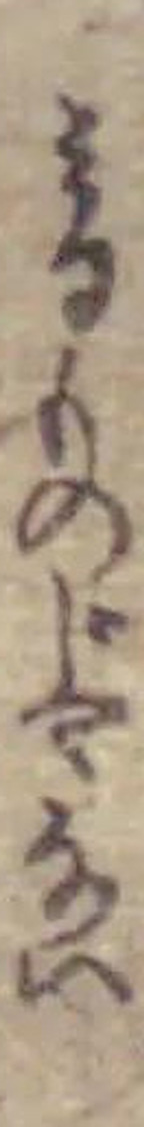みるものじやない
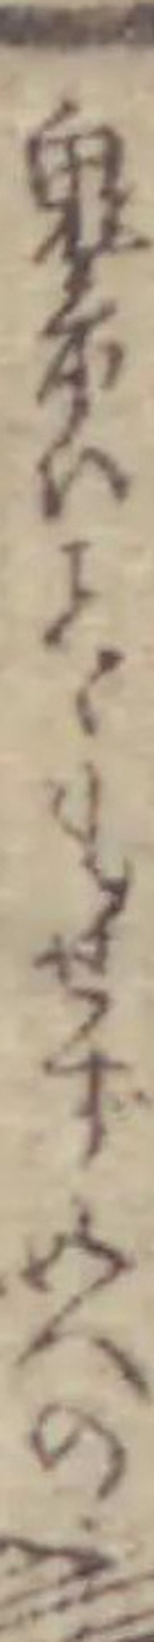鬼市はことゝもせず五人の
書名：鬼子宝 3巻
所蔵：国立国会図書館 National Diet Library, JAPAN
